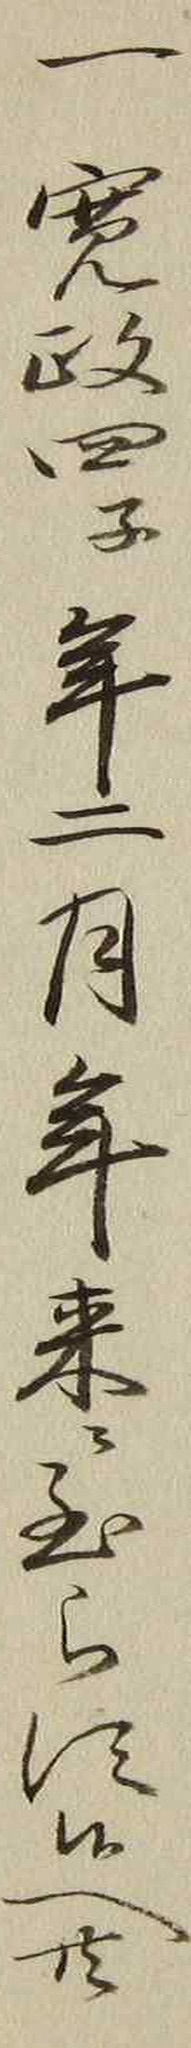一寛政四子年二月年来に至らす候へ共
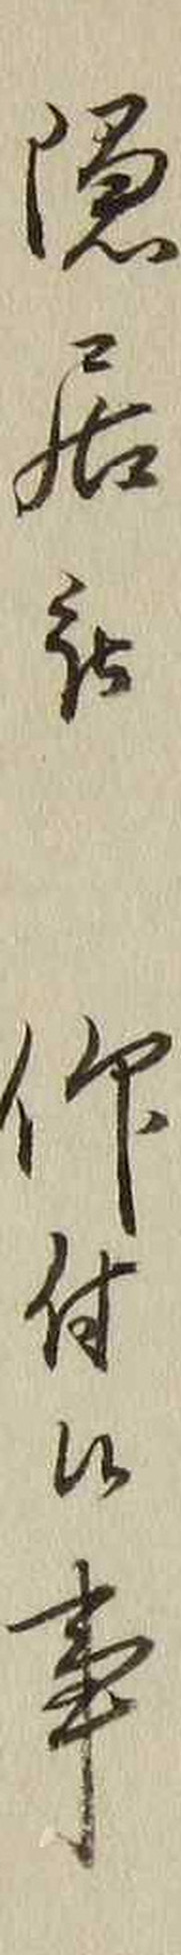隠居被仰付候事
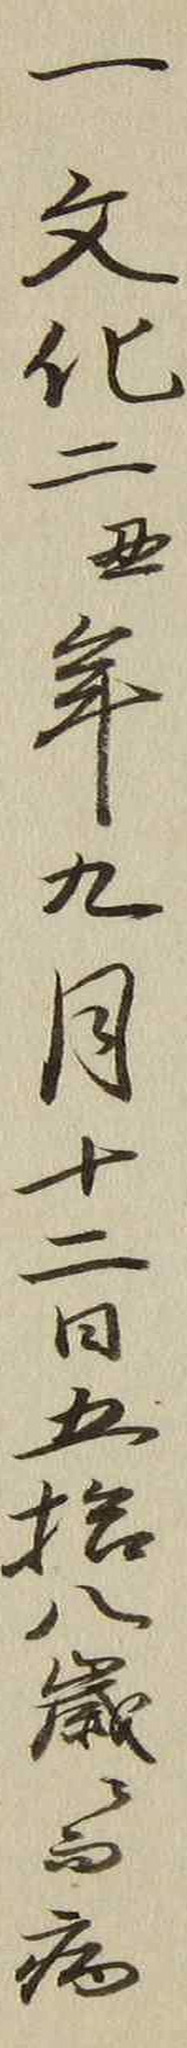一文化二丑年九月十二日五拾八歳に而病
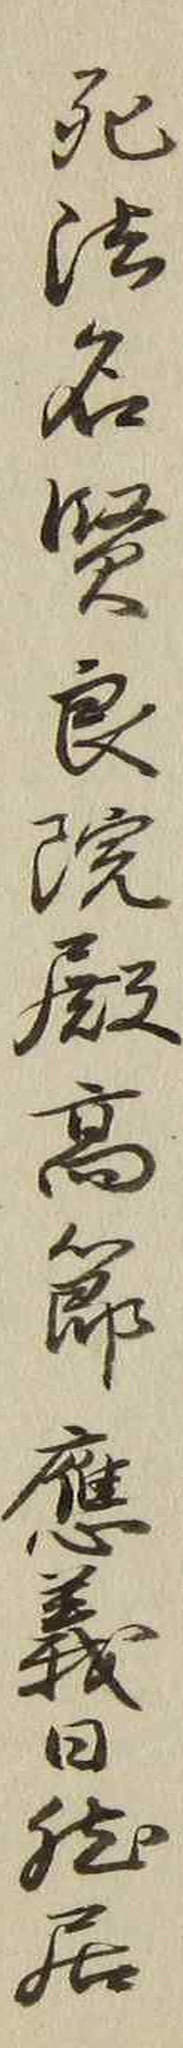死法名賢良院殿高節応義日然居
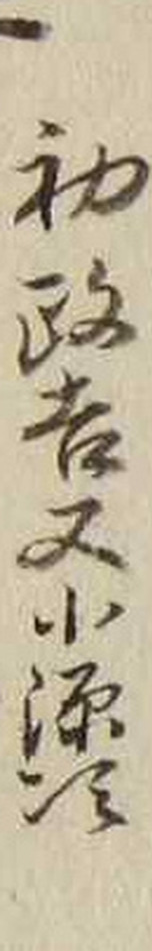初政吉又小源次
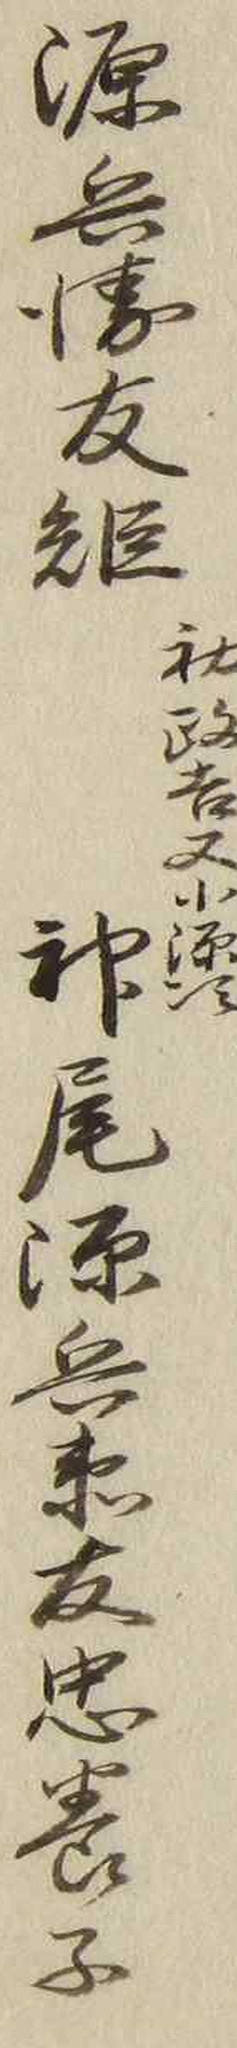源兵衛友矩神尾源兵衛友忠養子

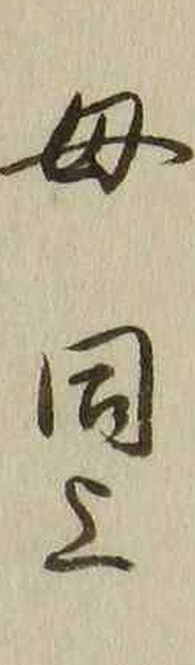母同上
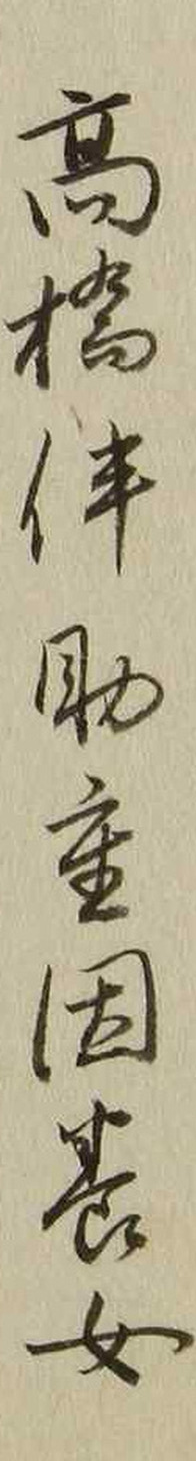女高橋伴助重因養女
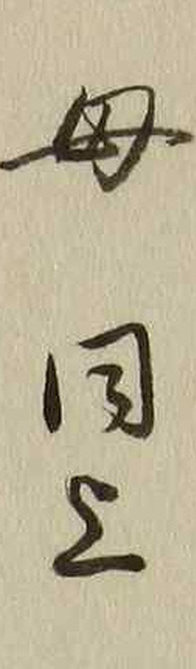母同上
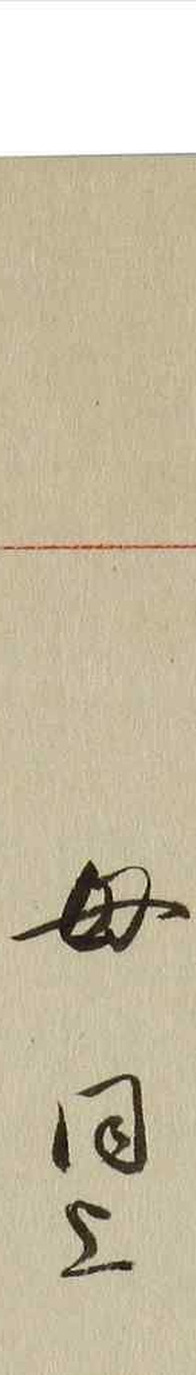母同上
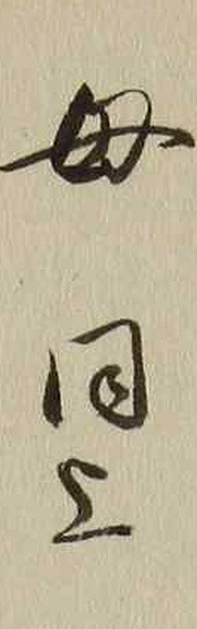母同上
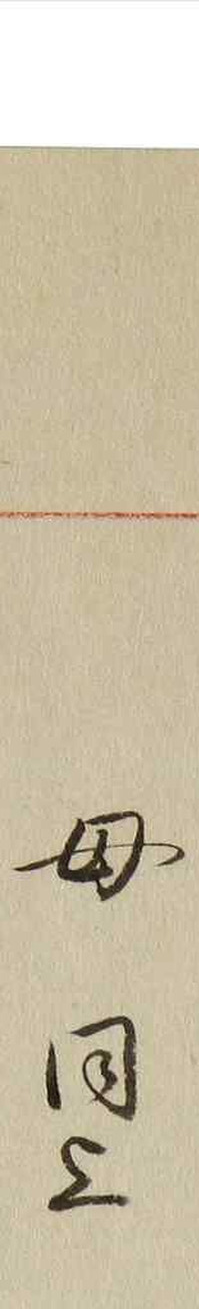母同上
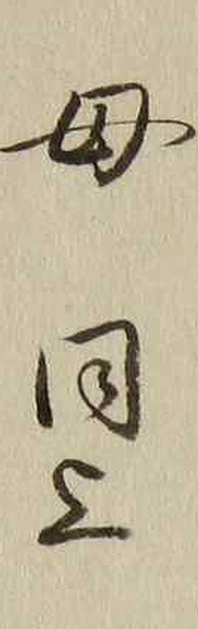母同上
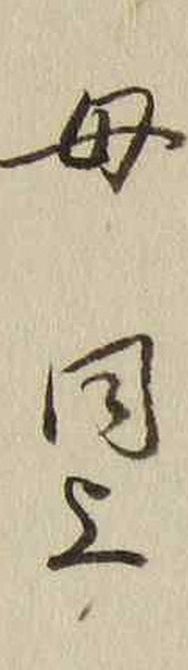母同上
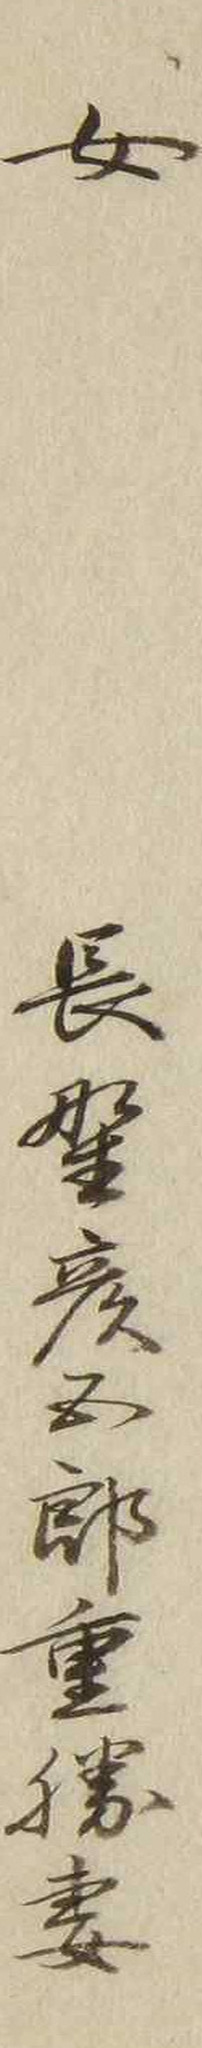女長野彦五郎重勝妻
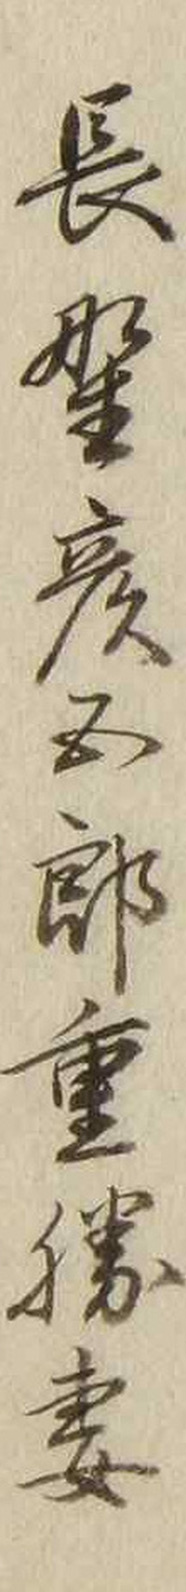女長野彦五郎重勝妻
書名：諸士系譜　巻之133　た之部9
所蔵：会津若松市立会津図書館
